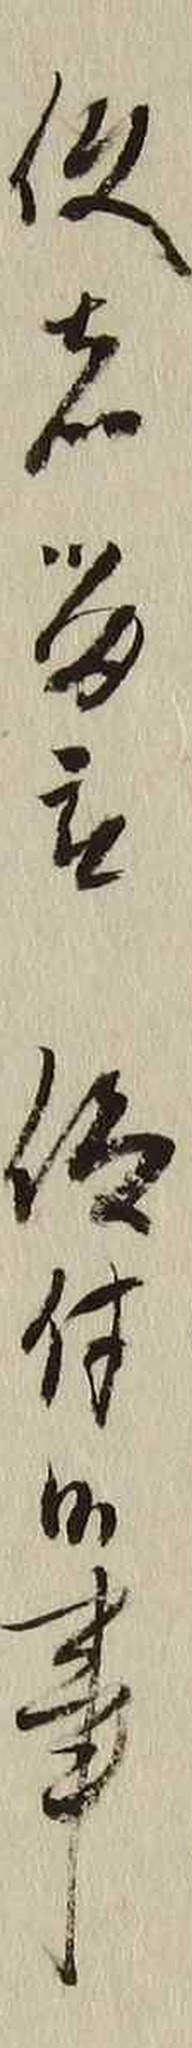使者留被仰付候事
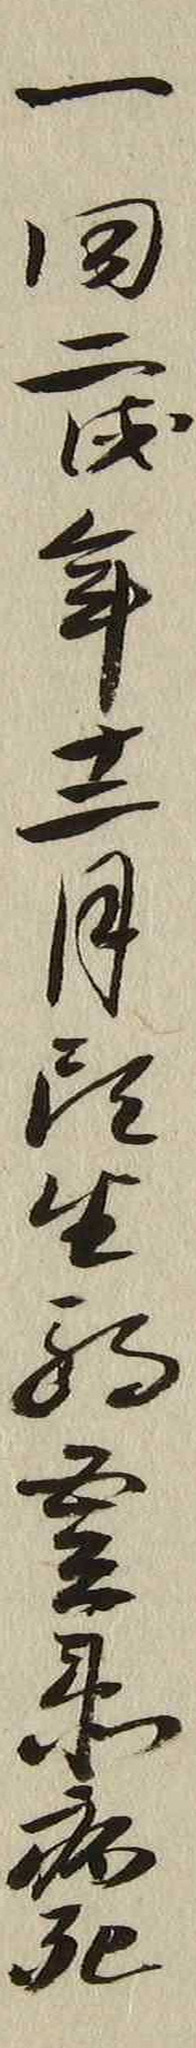一同二戌年十二月頭生駒五兵衛病死
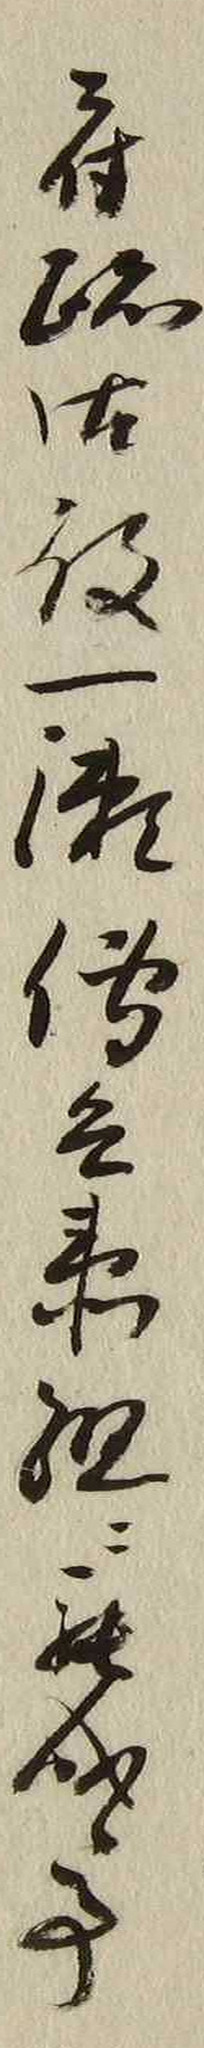ニ付跡御役一瀬伝兵衛組ニ罷成候事
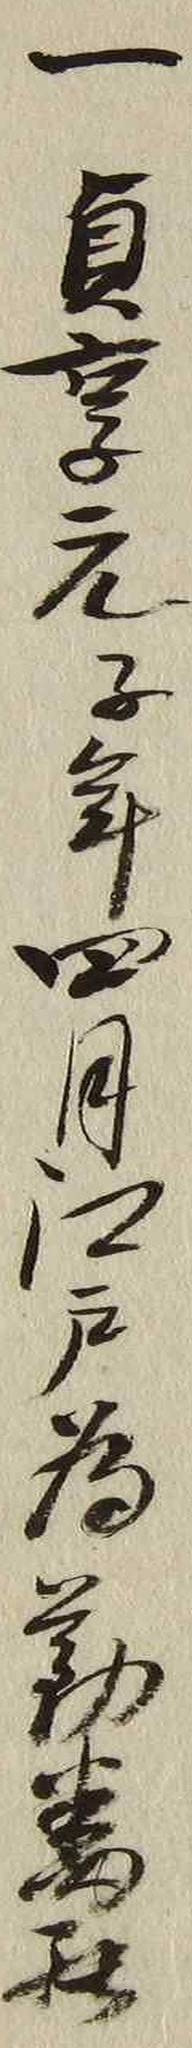一貞享元子年四月江戸為勤番罷
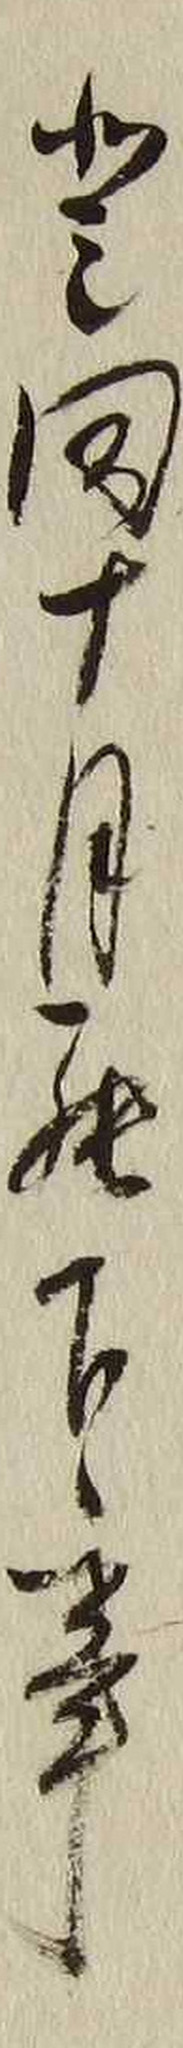登同十月罷下候事
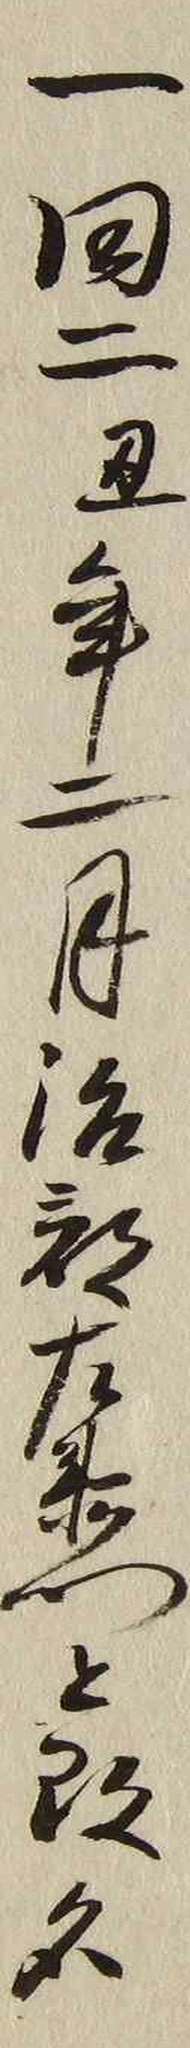一同二丑年二月治部左衛門と改名
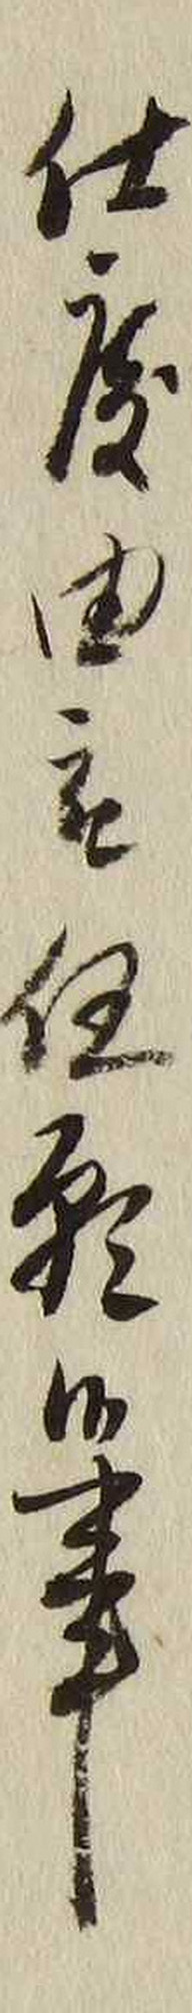仕度由被任願候事
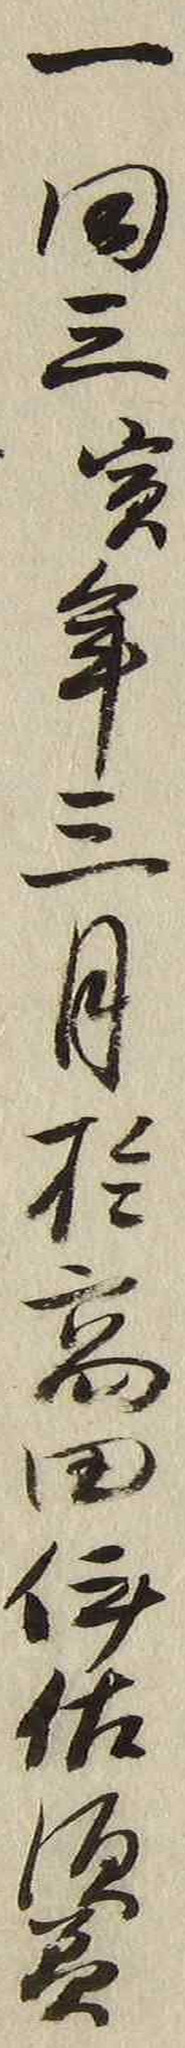一同三寅年三月於高田伊佐須美
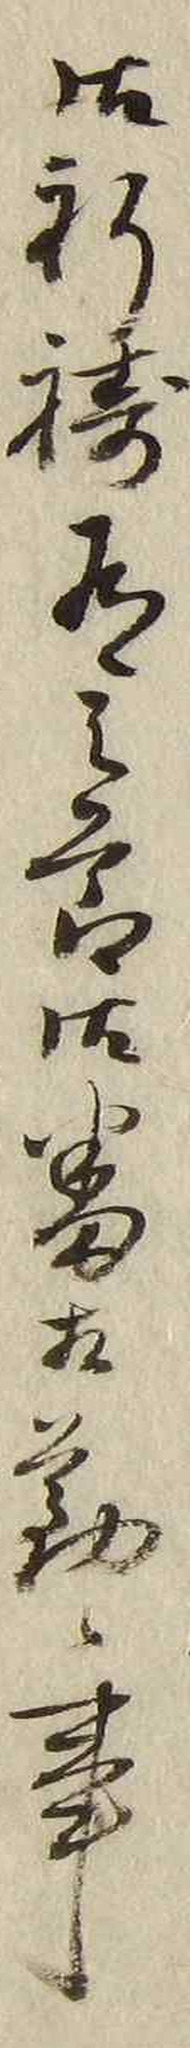御祈祷有之節御番相勤候事

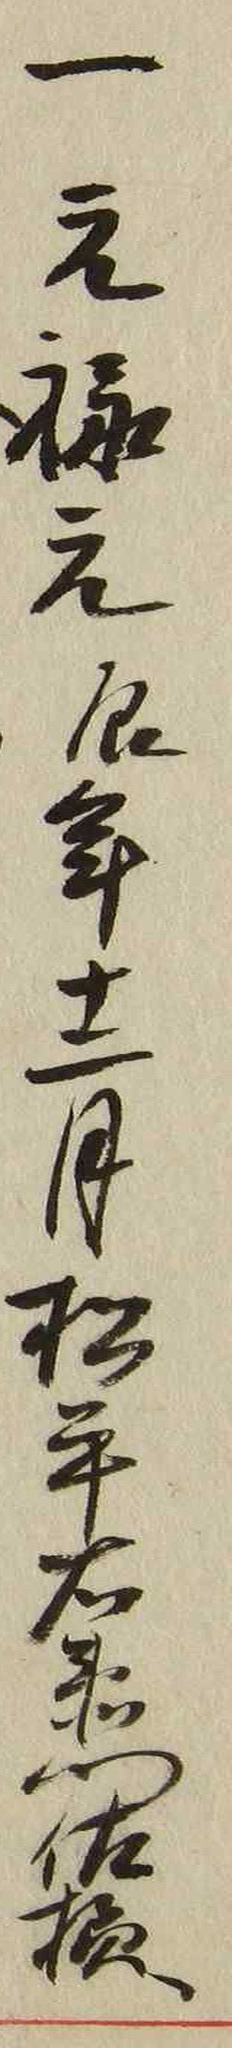一元禄元辰年十二月松平右衛門佐様へ
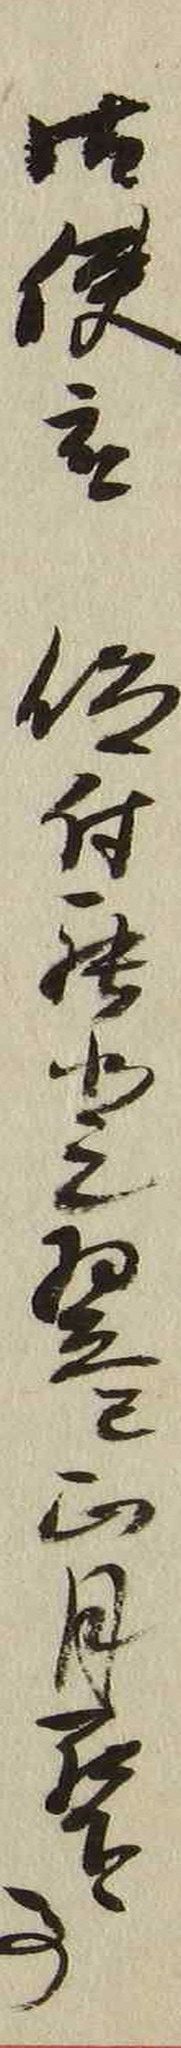御使被仰付罷登翌巳正月罷下候事
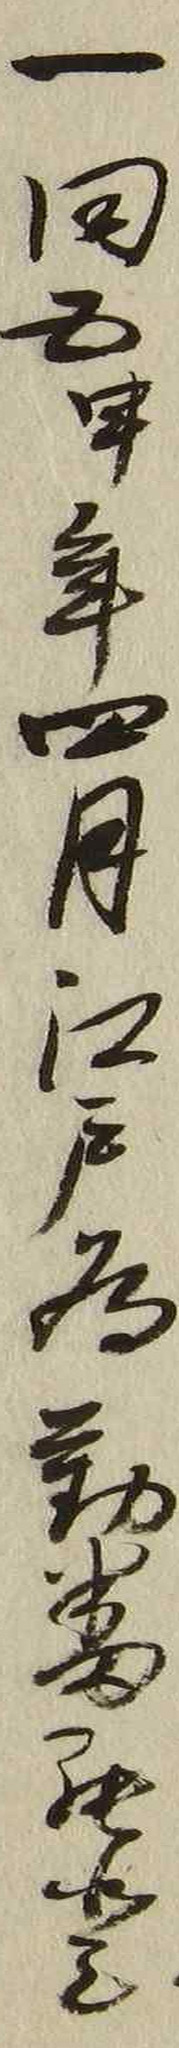一同五申年四月江戸為勤番罷登
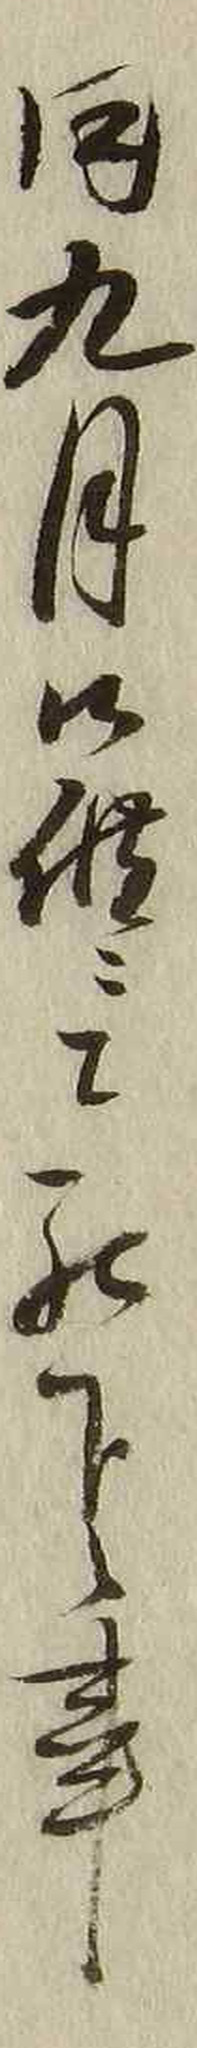同九月御供ニて罷下候事
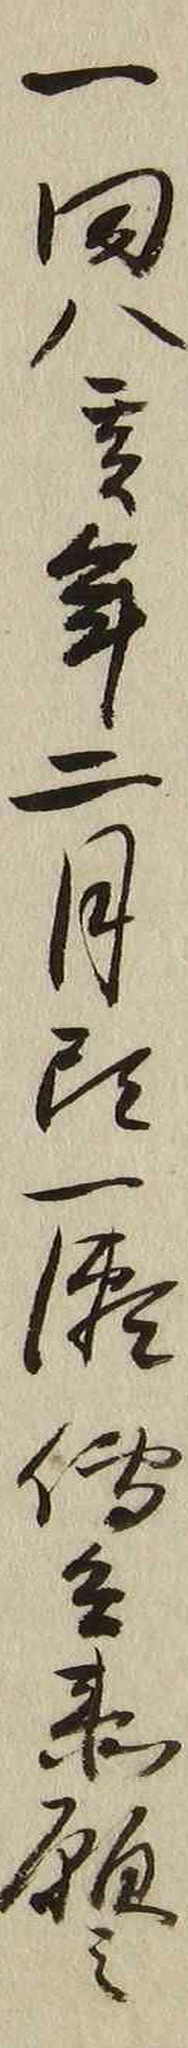一同八亥年二月頭瀬一伝兵衛願之
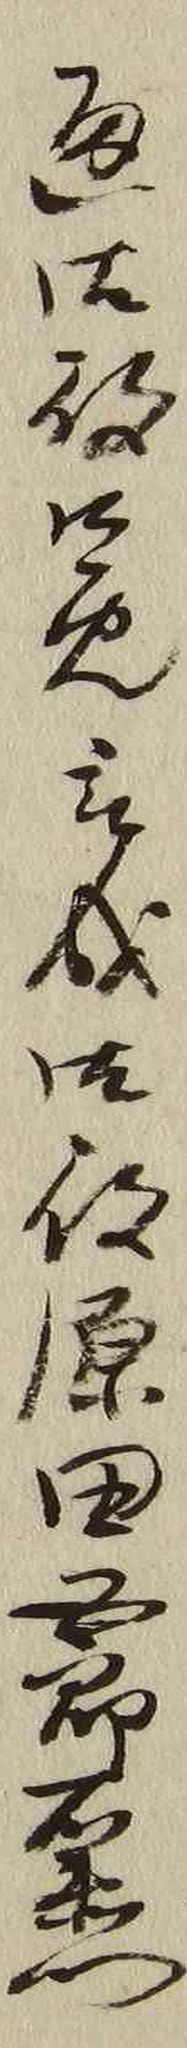通御役御免被成御役原田五郎右衛門
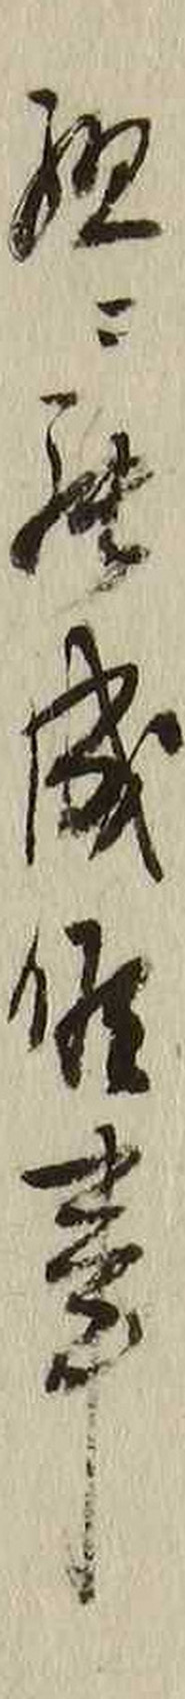組ニ罷成候事
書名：諸士系譜　巻之355　す之部5
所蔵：会津若松市立会津図書館
